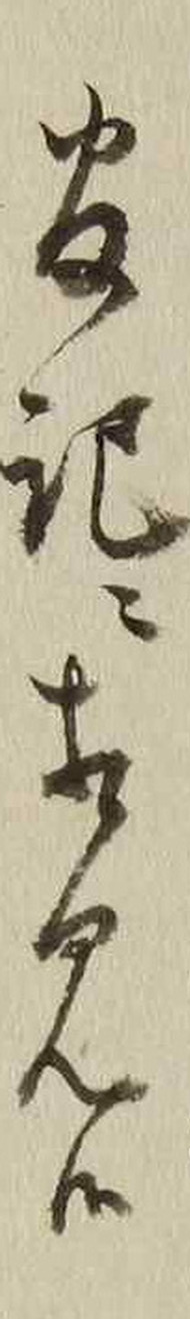官記ニ相見候
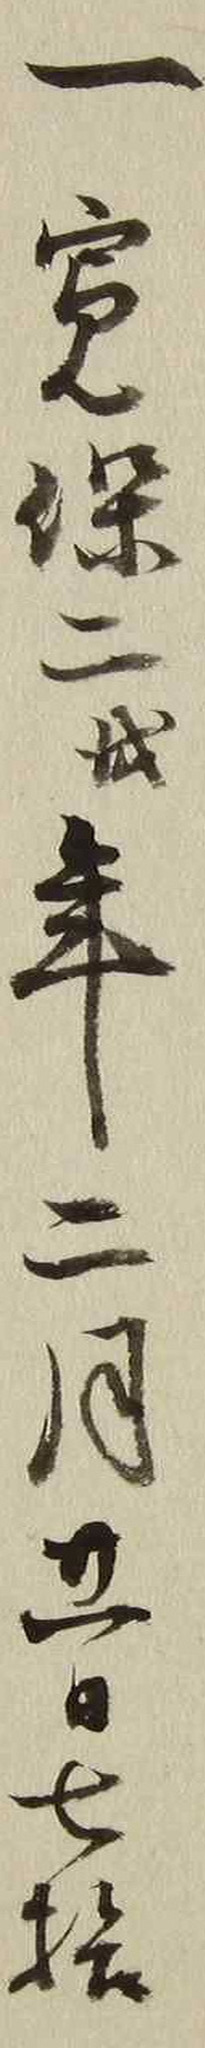一寛保二戌年二月廿一日七拾
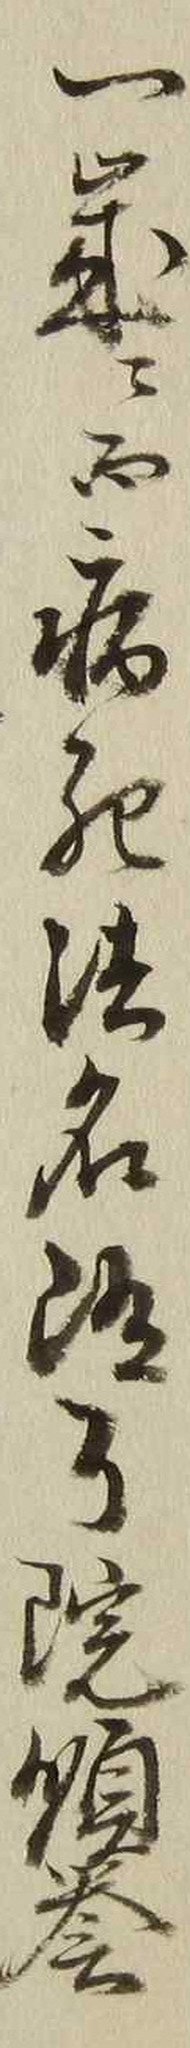一歳ニ而病死法名随了院順誉
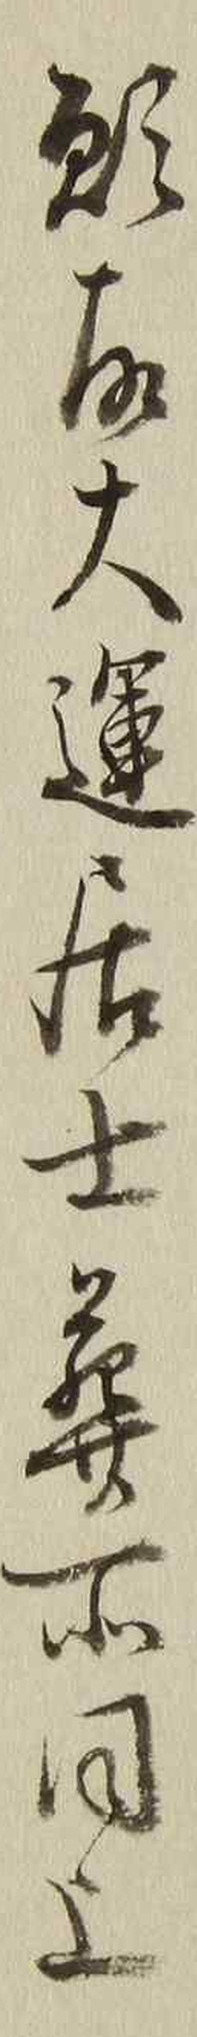願故大運居士葬所同上
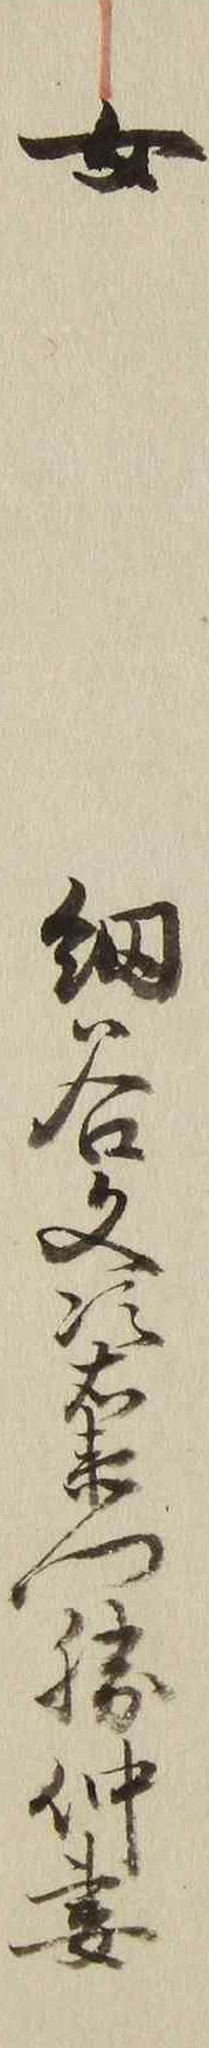女細谷文次右衛門勝仲妻
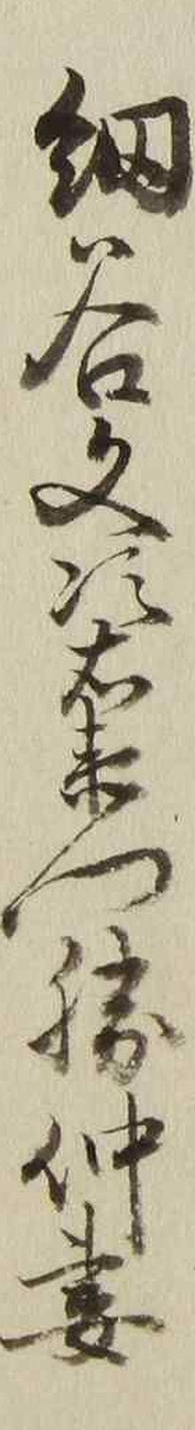女細谷文次右衛門勝仲妻
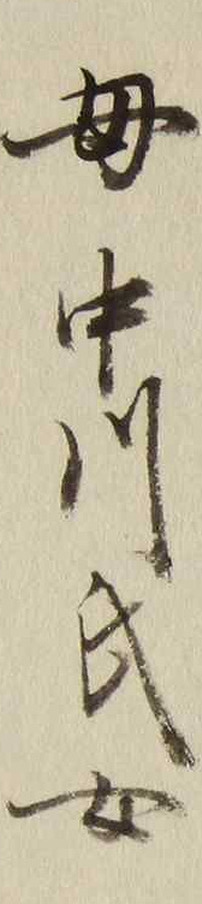母中川氏女

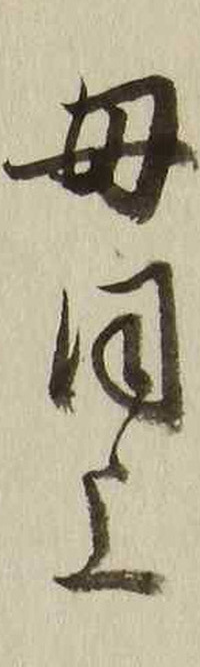母同上
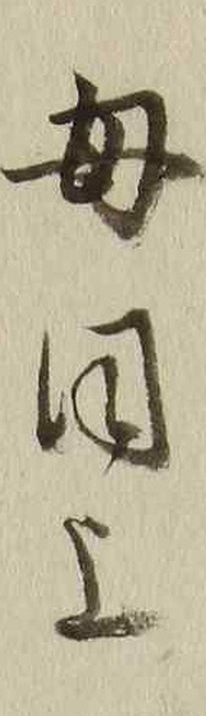母同上
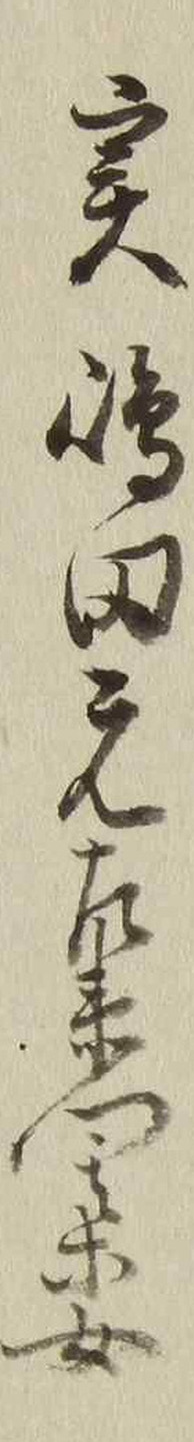実嶋田元左衛門某女
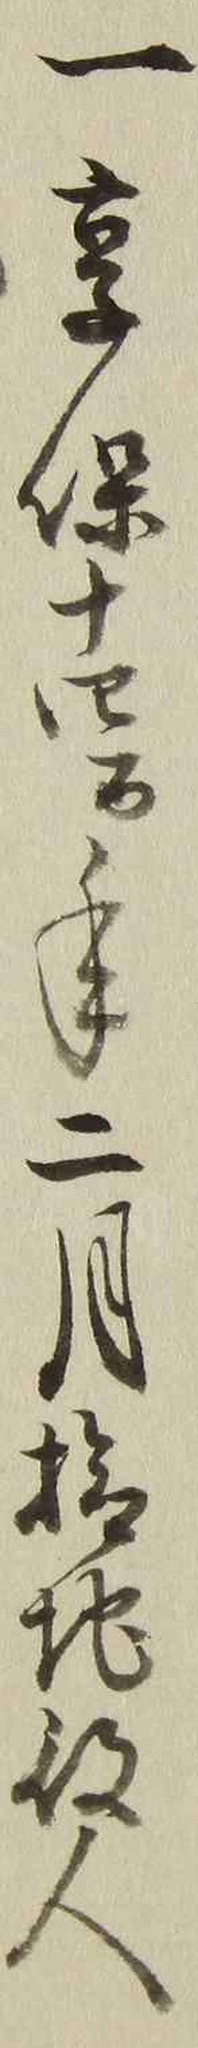一享保十四酉年二月検地役人
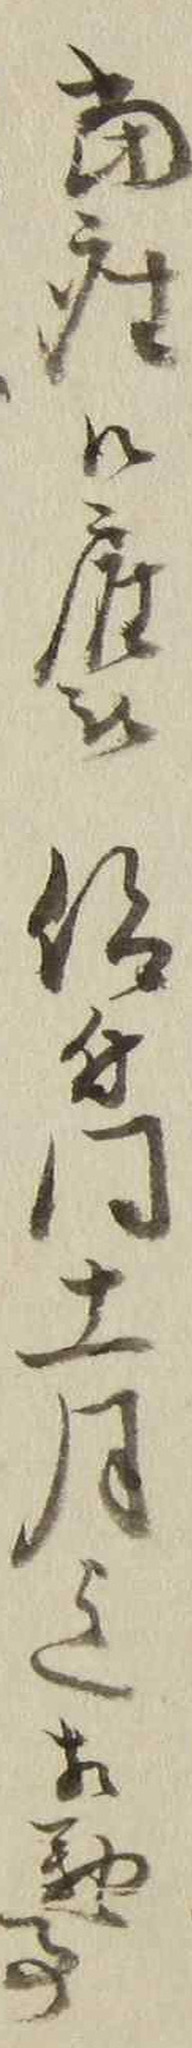当座御雇被仰付同十一月迄相勤候事
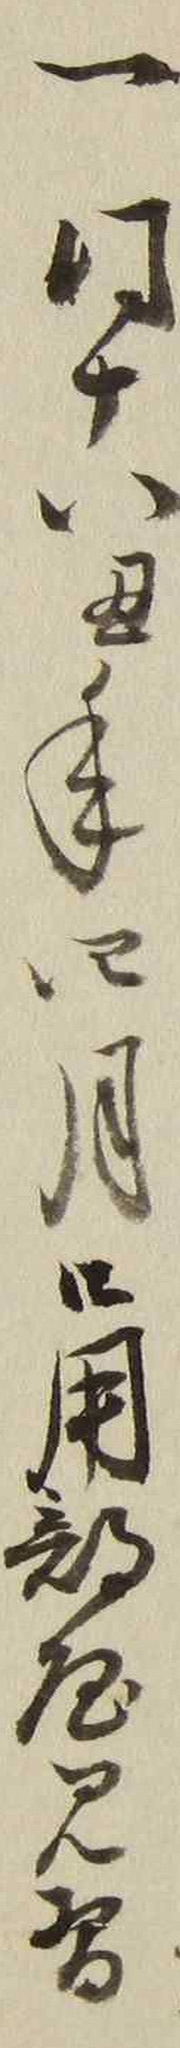一同十八丑年四月御用部屋見習
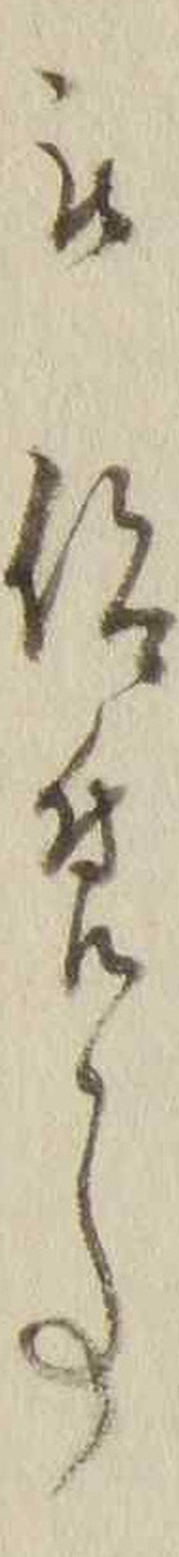被仰付候事

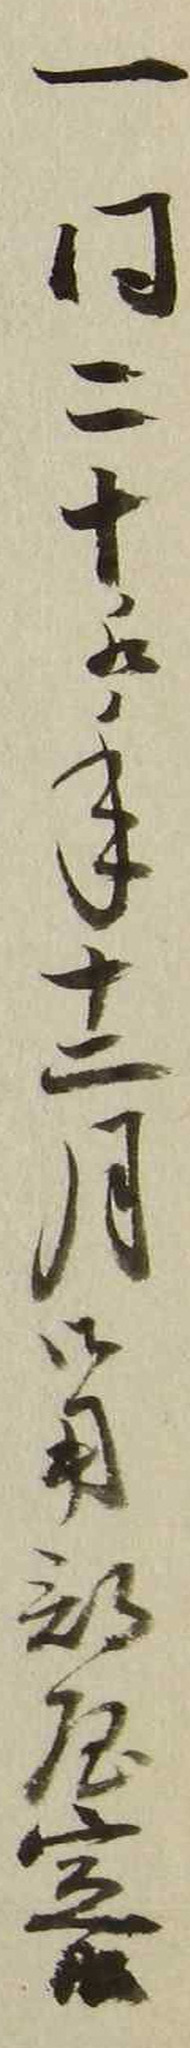一同二十卯年十二月御用部屋定御
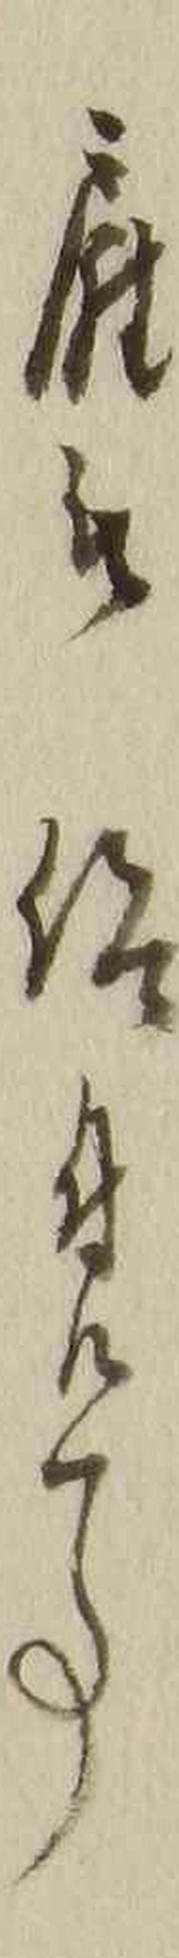雇被仰付候事
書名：諸士系譜　巻之53　に之部4
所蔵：会津若松市立会津図書館
